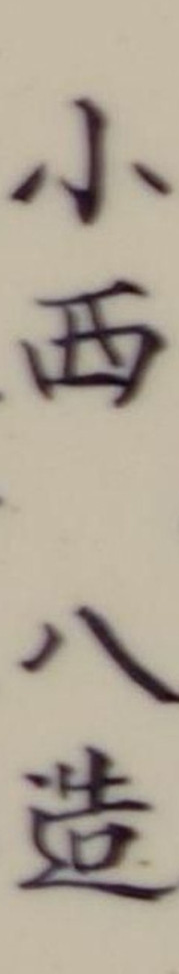小西八造
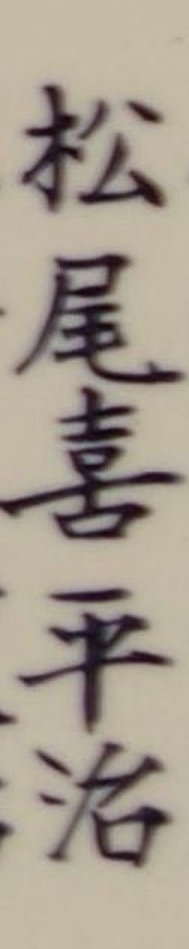松尾喜平治
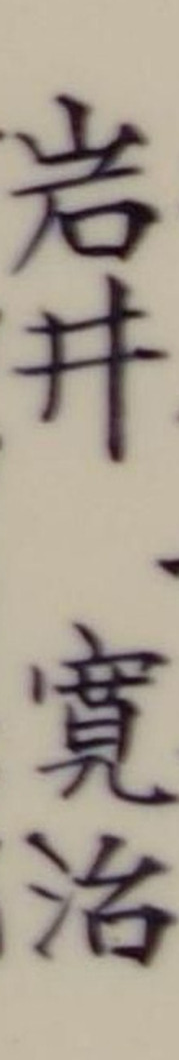岩井寛治
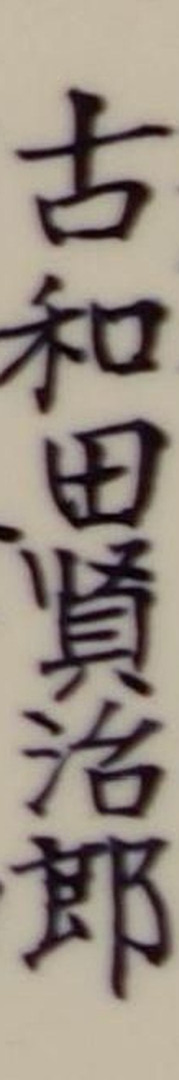古和田賢治郎
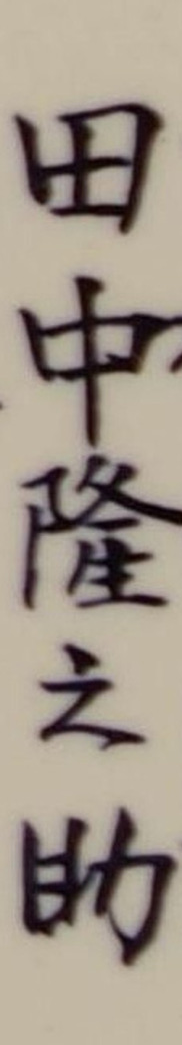田中隆之助
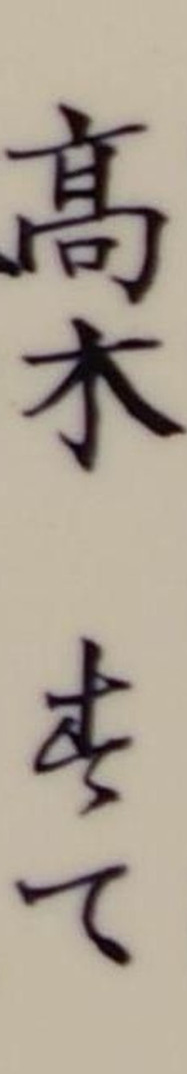高木すて
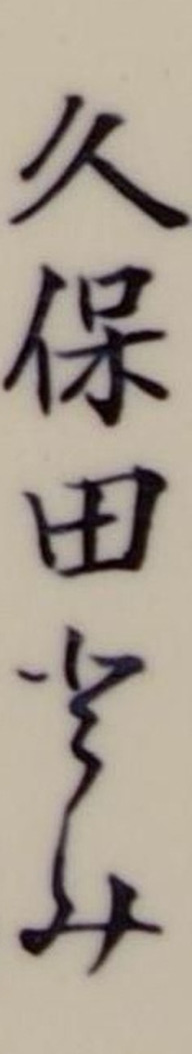久保田とみ
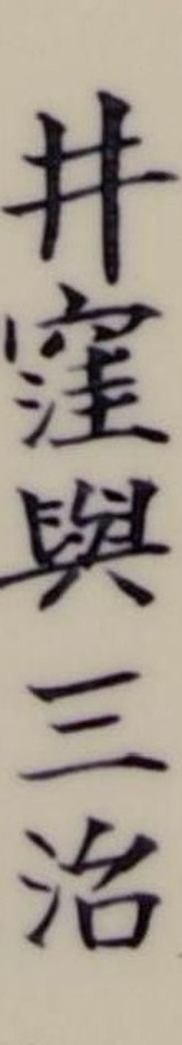井窪与三治
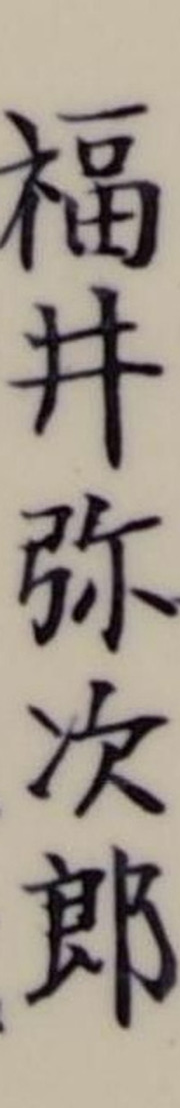福井弥次郎
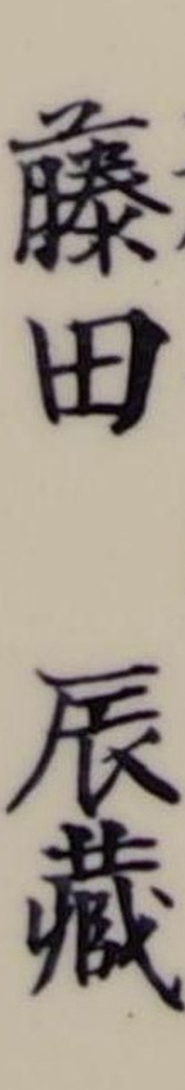藤田辰蔵
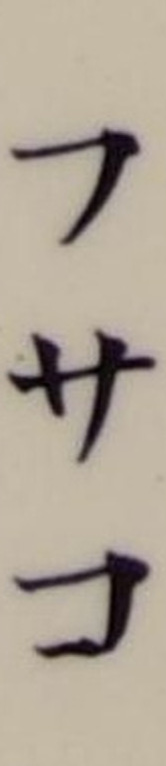フサコ
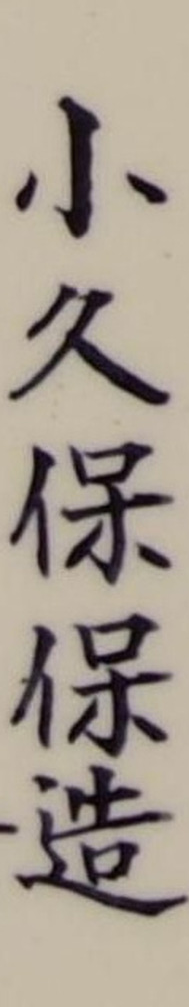小久保保造
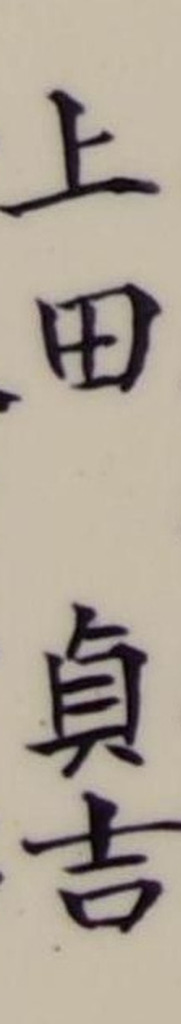上田貞吉
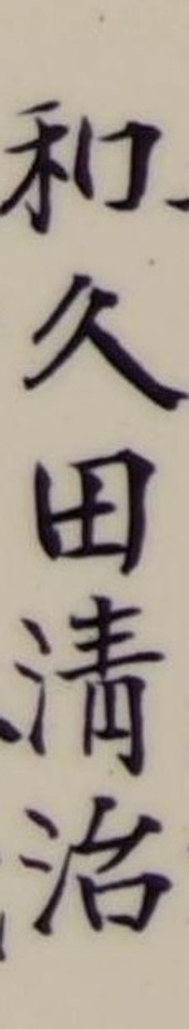和久田清治
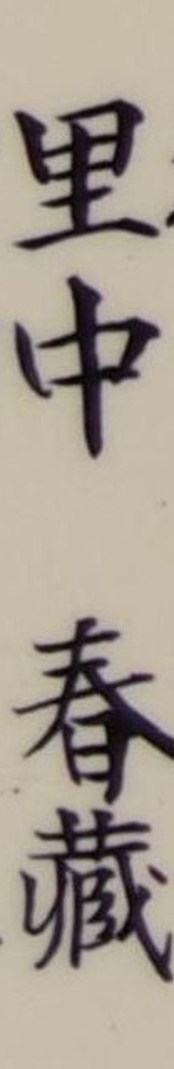里中春蔵
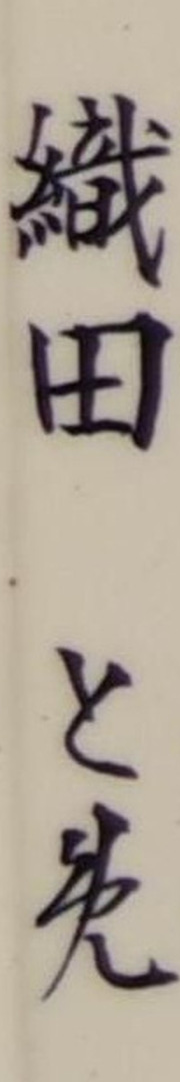織田とめ
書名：M~S
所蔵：高野山金剛峯寺
